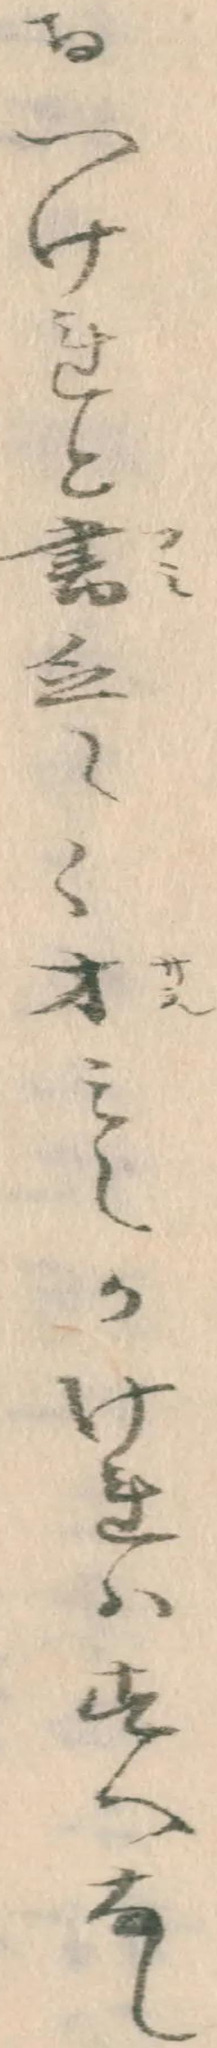るへけれと書乏しく才みしかけれはすへなし
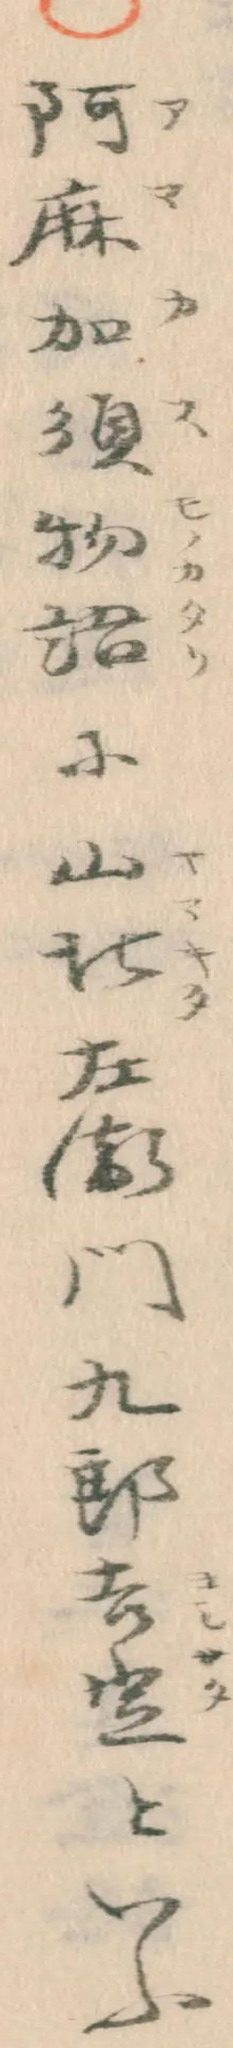○阿麻加須物語に山北左衛門九郎吉定といふ
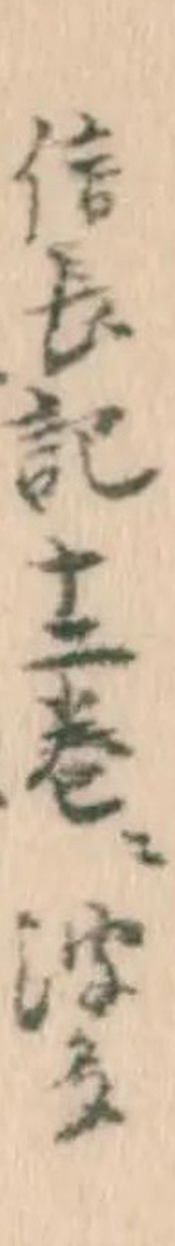信長記十二巻波多
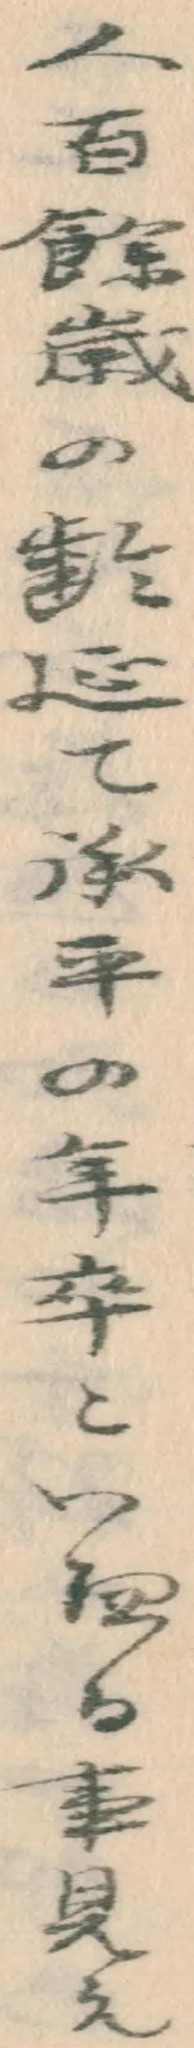人百餘歳齢延て承平の年卒といへる事見え
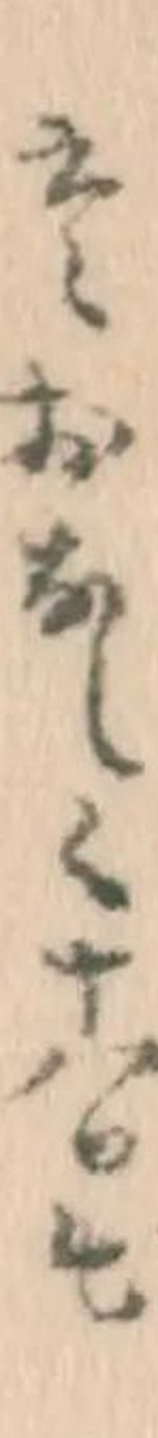云々おなしく十八日出
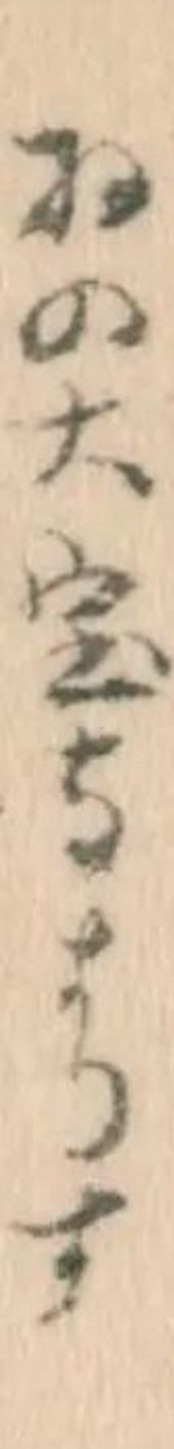羽の大宝寺よりす
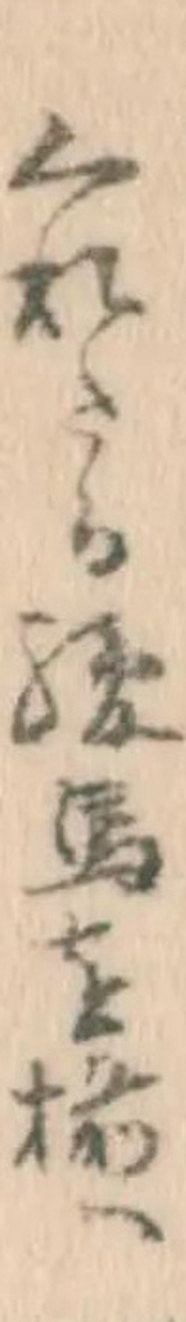くれたる駿馬を揃へ
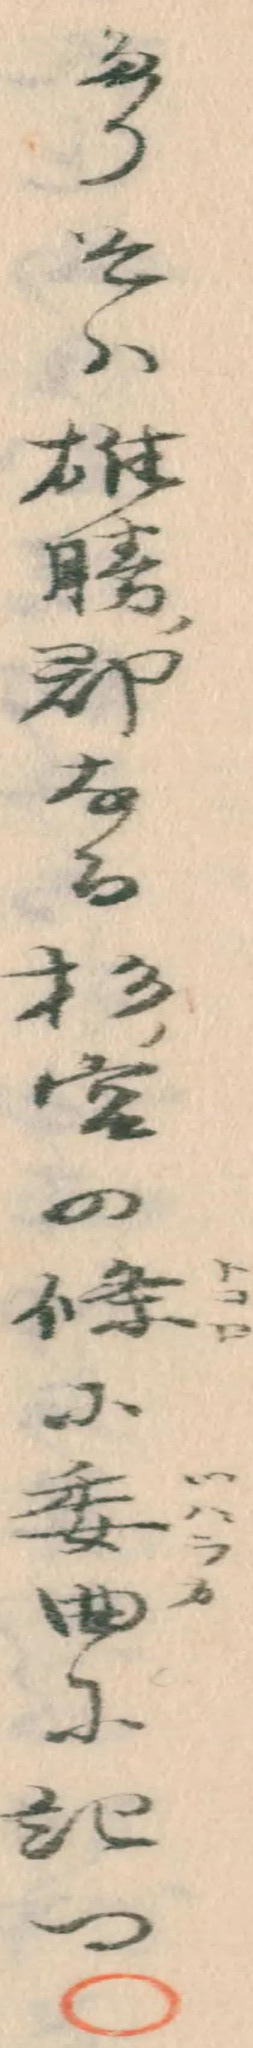たりそは雄勝郡なる杉宮の條に委曲に記つ○
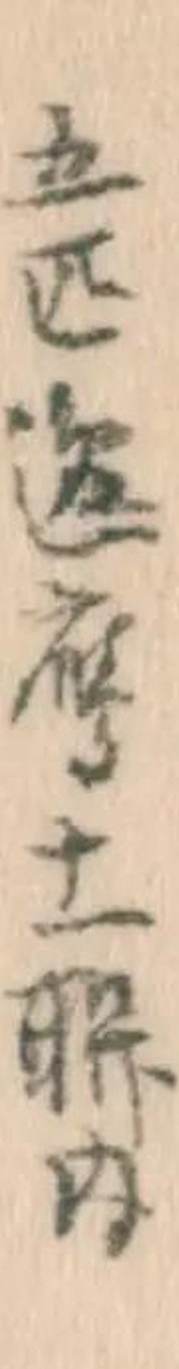五匹逸鷹十一聯内
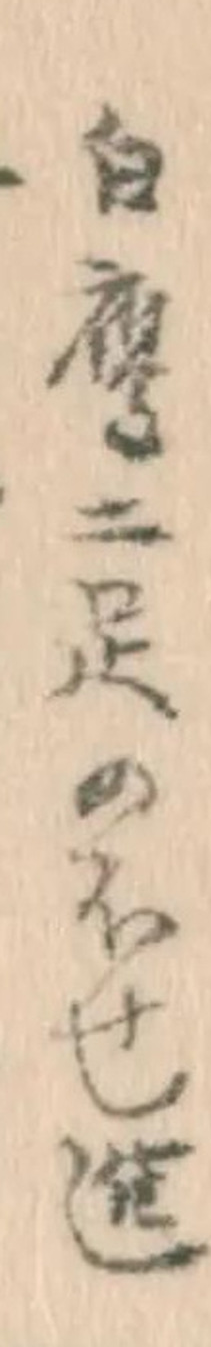白鷹二足のほせ進
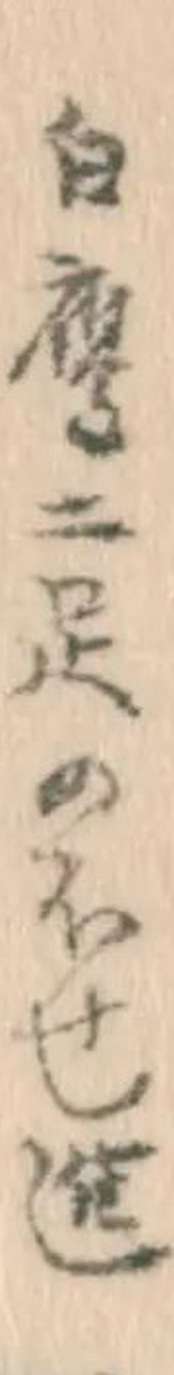白鷹二足のほせ進
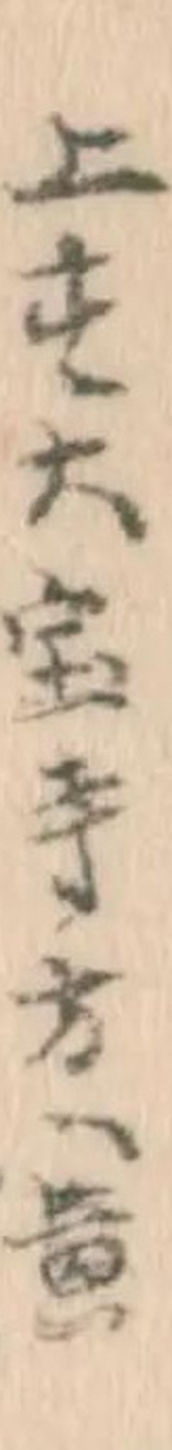上す大宝寺方へ黄
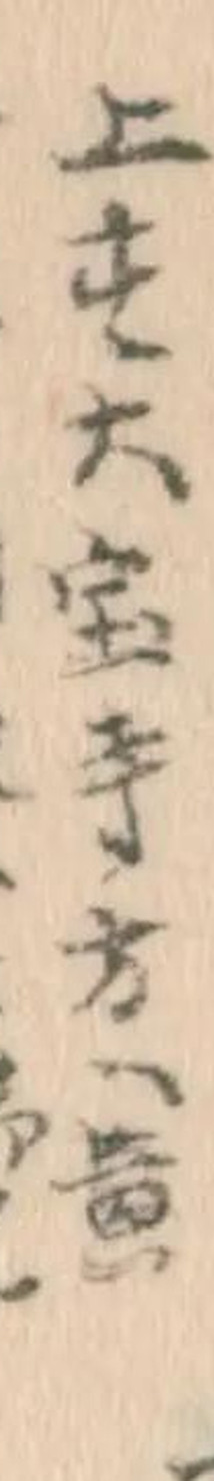上す大宝寺方へ黄
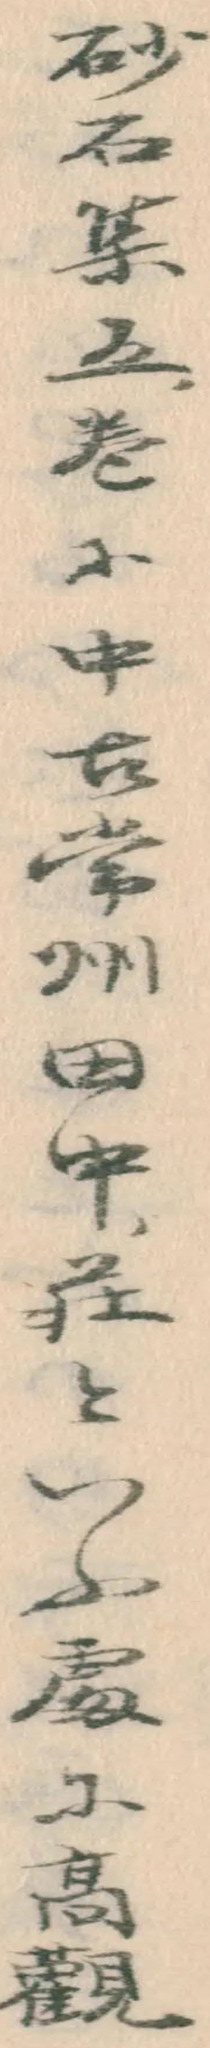砂石集五巻に中古常州田中荘といふ䖏に髙觀
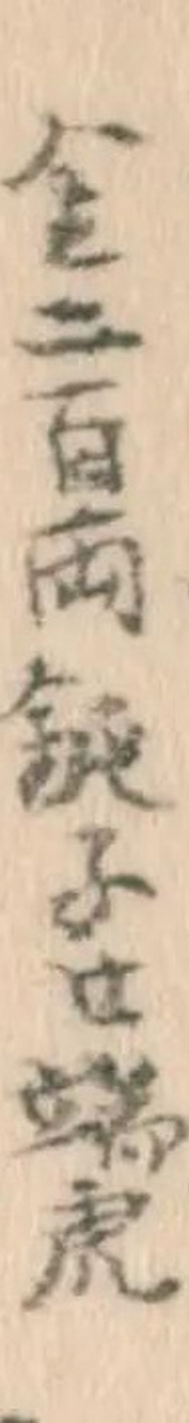金二百両鈍子廿端虎
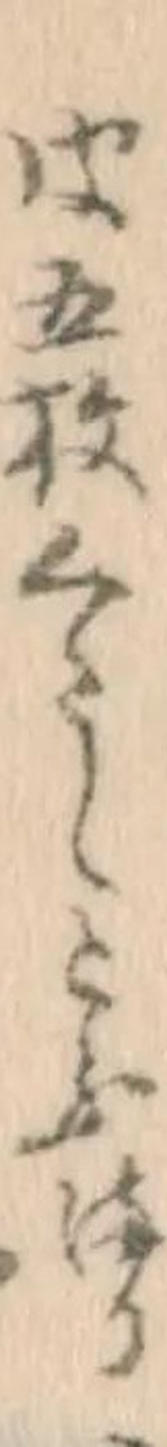皮五枚くたしたふまり
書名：眞澄遊覽記[第2冊]
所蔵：国立国会図書館 National Diet Library, JAPAN
